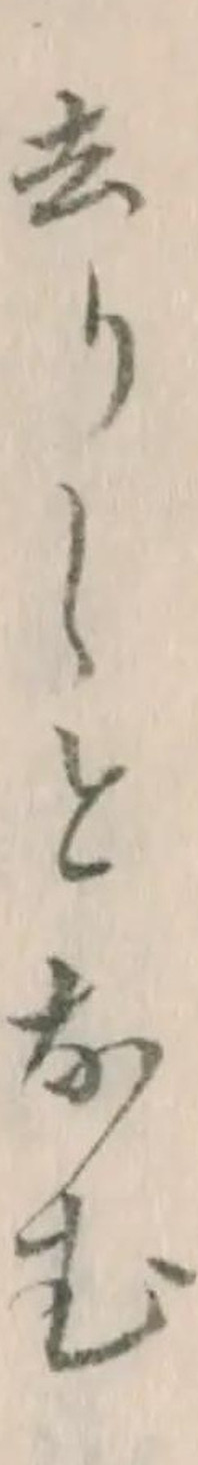去りしとなむ
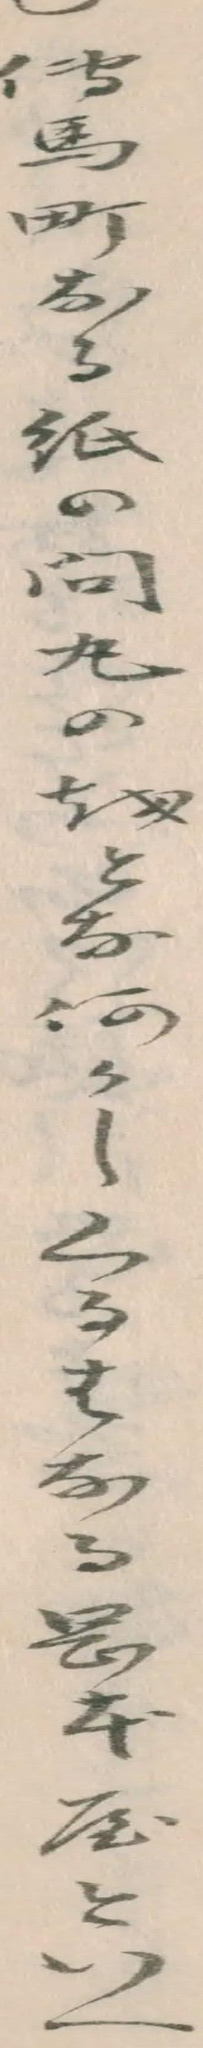○伝馬町なる紙の問丸のをとな何かしくるはなる岡本屋といへ
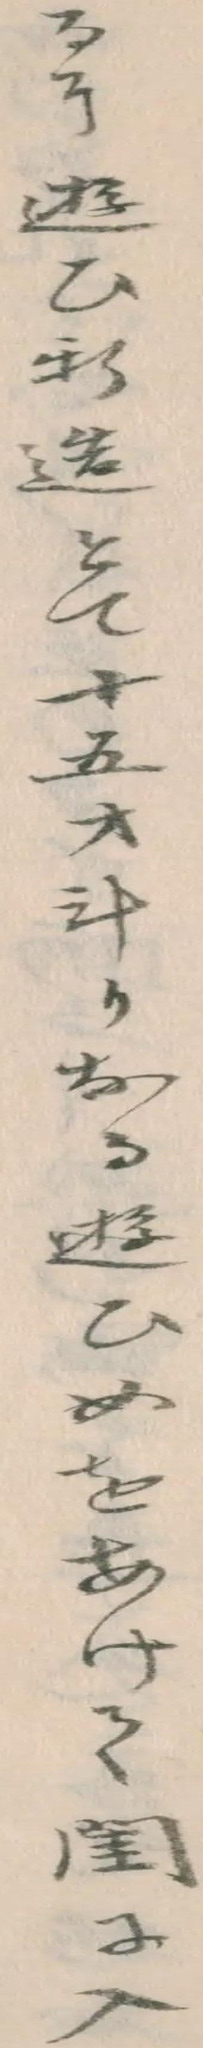るに遊ひ新造とて十五才斗りなる遊ひめをあけて閨に入
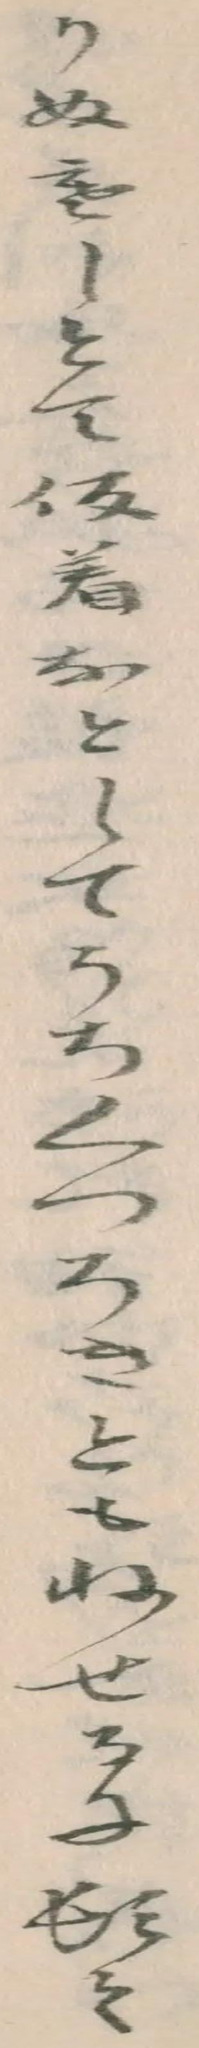りぬ寒しとて仮着なとしてうちくつろきともねせるに頓て
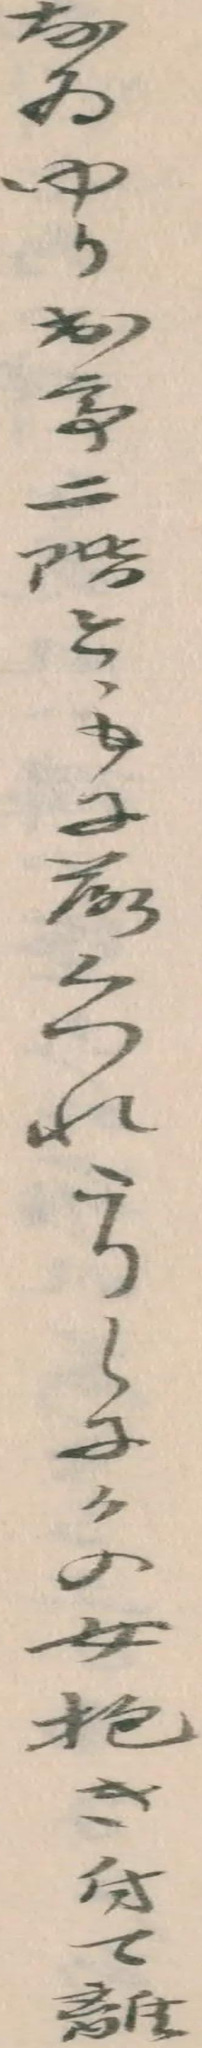なゐゆり出て二階とゝもに落くつれたりしにかの女抱き付て離
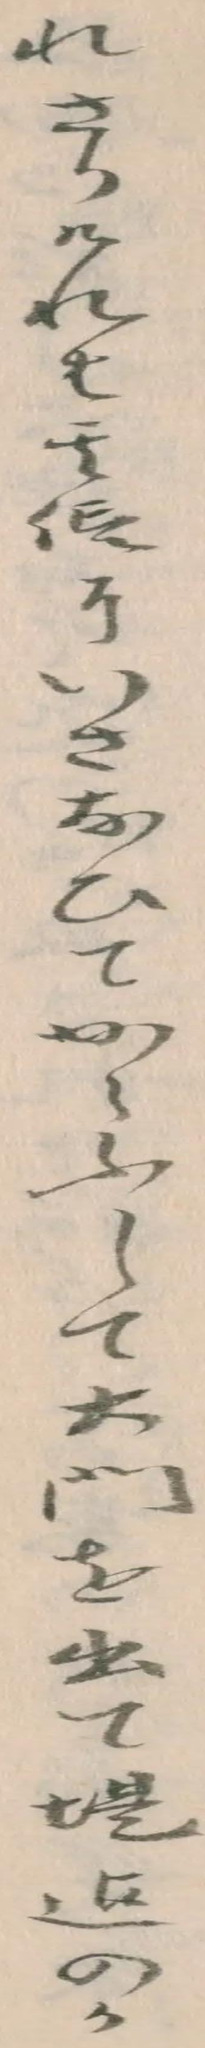れさりけれは其侭にいさなひてからふして大門を出て堤迄のか
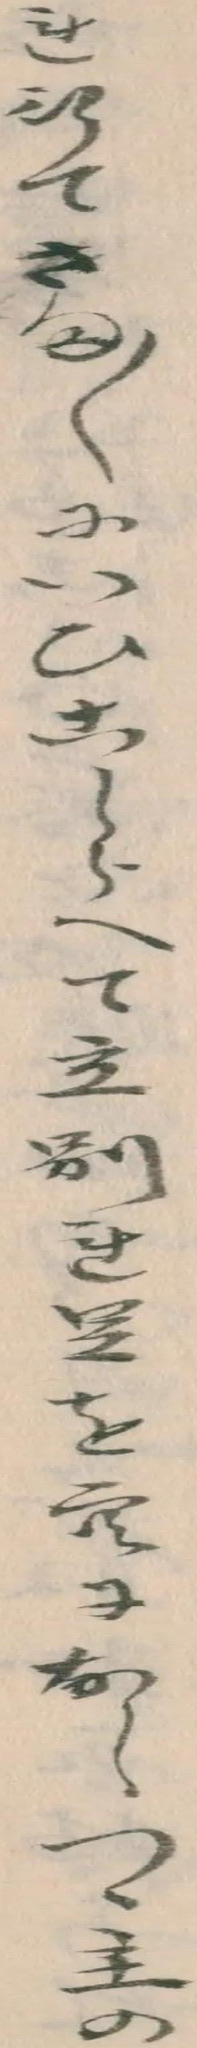れ行てさま〳〵にいひこしらへて立別れ足を空になしつゝ主の
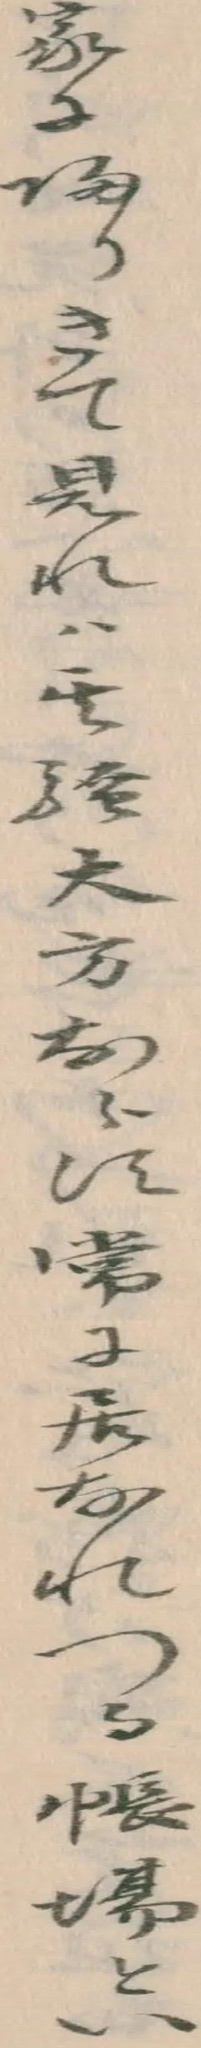家に帰りきて見れは其騒大方ならす常に居なれつる帳場とい
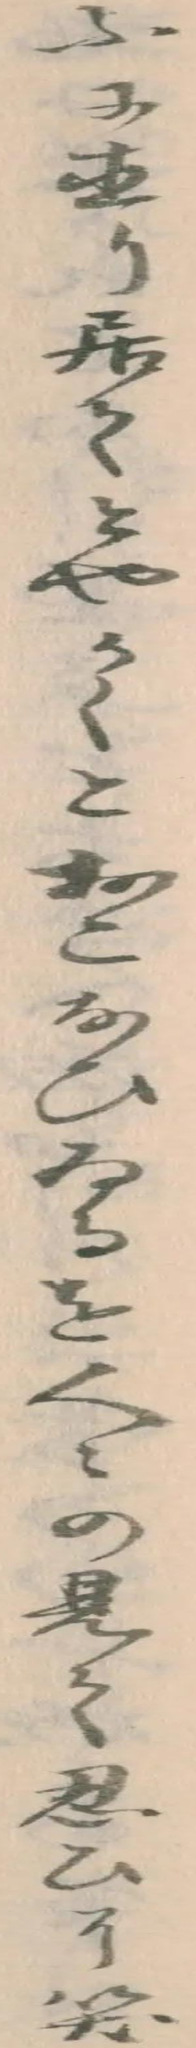ふに直り居てとやかくとおこなひゐるを人々の見て忍ひに笑
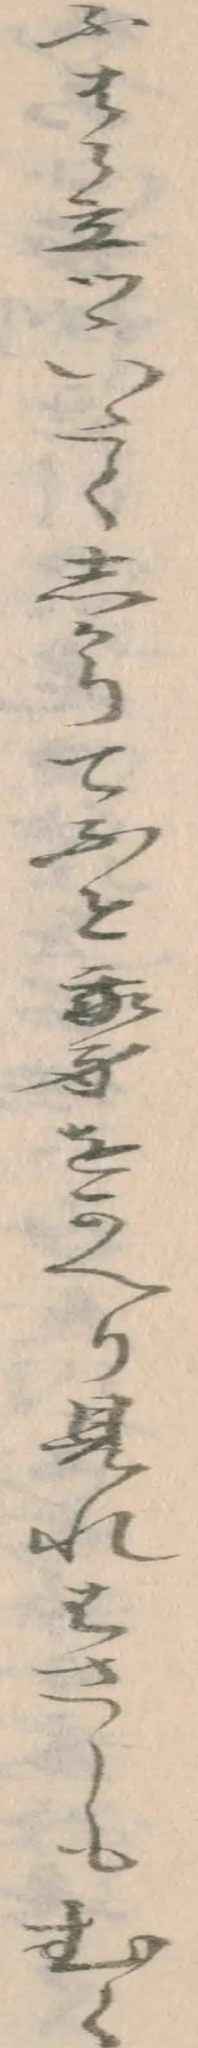ふはら立ツゝいたくしかりてふと我身をかへり見れはさしもむく
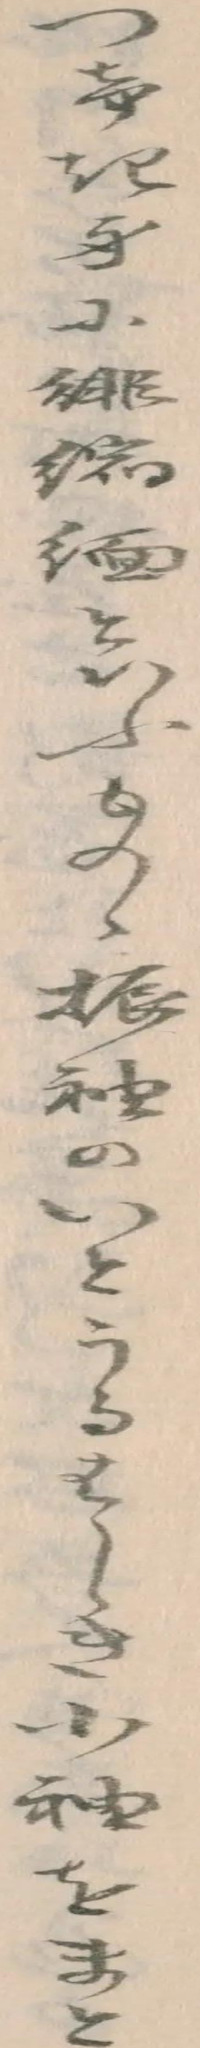つけき身に緋縮緬といふものゝ振袖のいとうるはしき小袖をまと
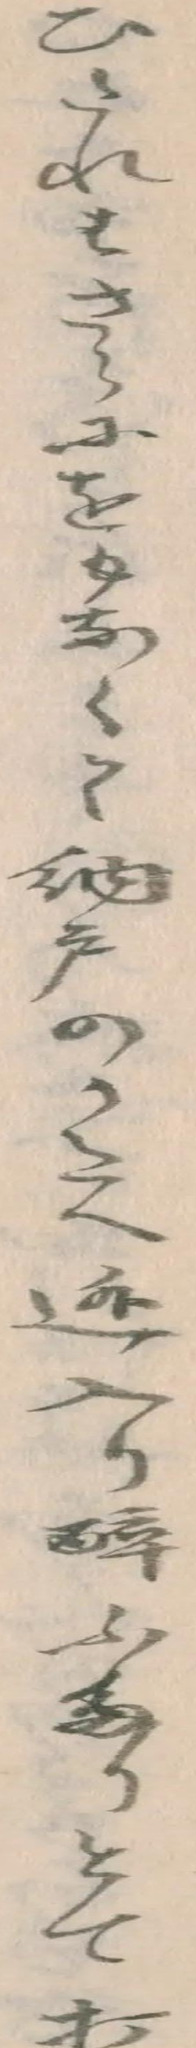ひたれはさらにをもなくて納戸のかたへ逃入り酔ふたりとて打
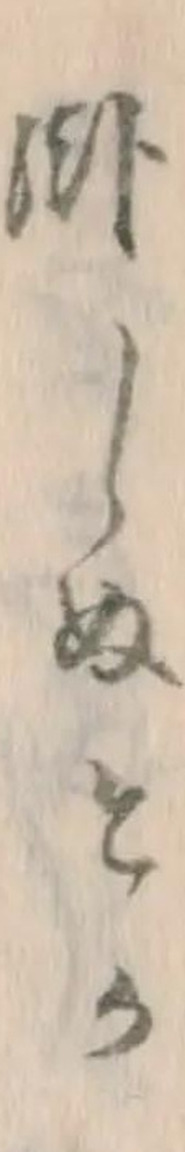臥しぬとか
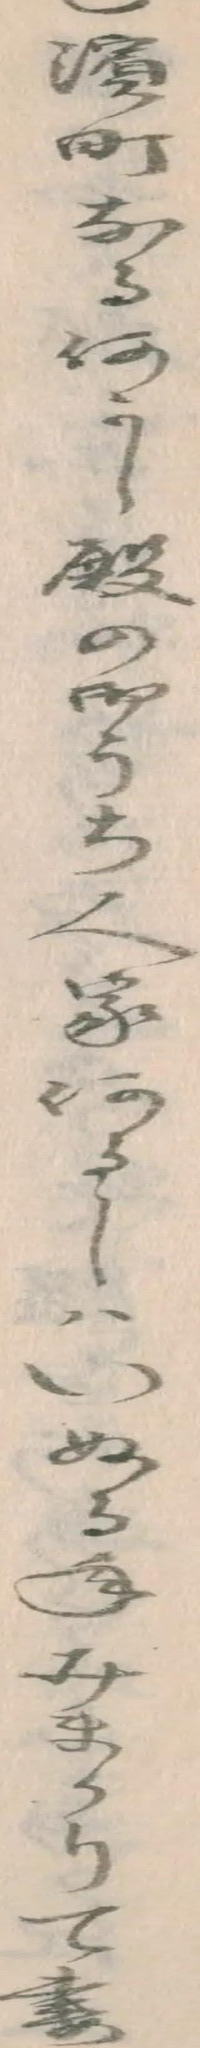○浜町なる何かし殿の御うち人家あるしはいぬる年みまかりて妻
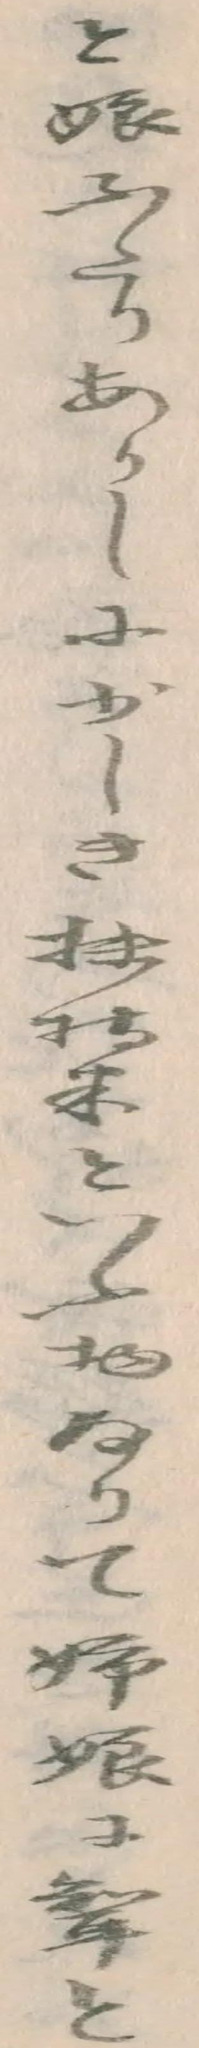と娘ふたりありしに少しき扶持米といふ物給りて姉娘に聟と
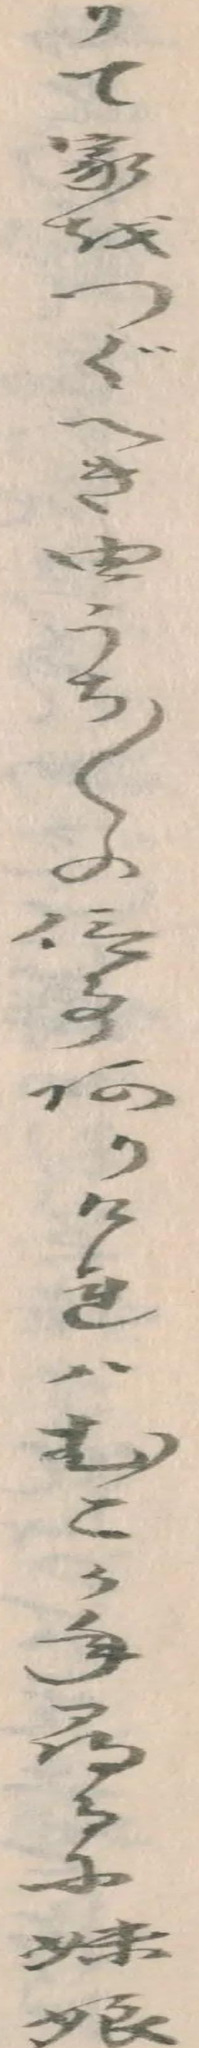りて家をつぐへき由うち〳〵の信事ありけれはむこか手尋るに妹娘
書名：地災撮要. 巻10(地震之部) 上,下
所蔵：国立国会図書館 National Diet Library, JAPAN
